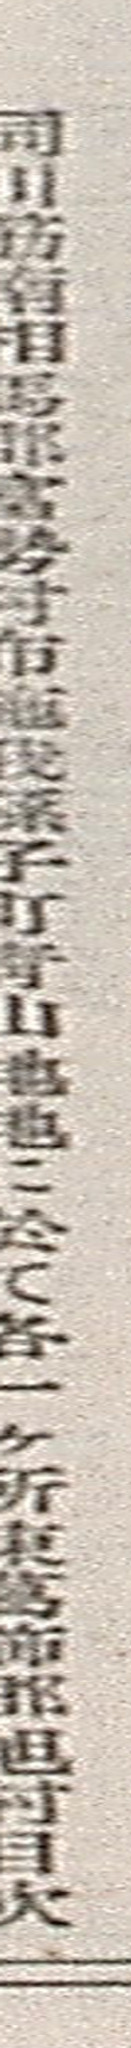同川筋南相馬郡富勢村布施我孫子町青山地地に於て各一ヶ所東葛飾郡旭村目吹
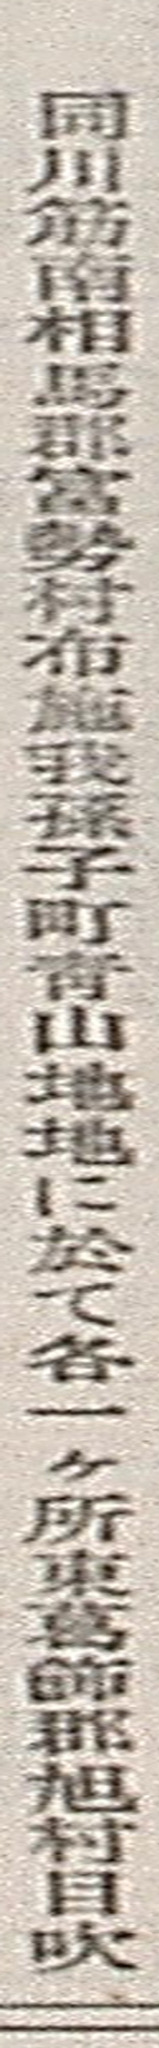同川筋南相馬郡富勢村布施我孫子町青山地地に於て各一ヶ所東葛飾郡旭村目吹
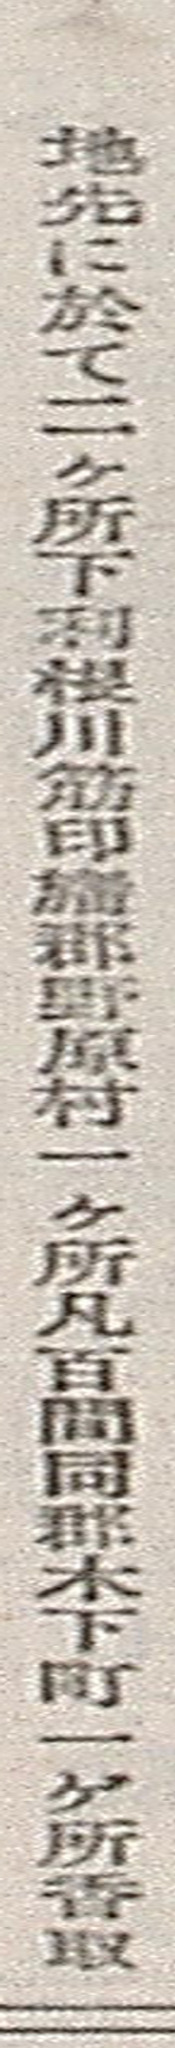地先に於て二ヶ所下利根川筋印旛郡野原村一ヶ所凡百間同郡木下町一ヶ所香取
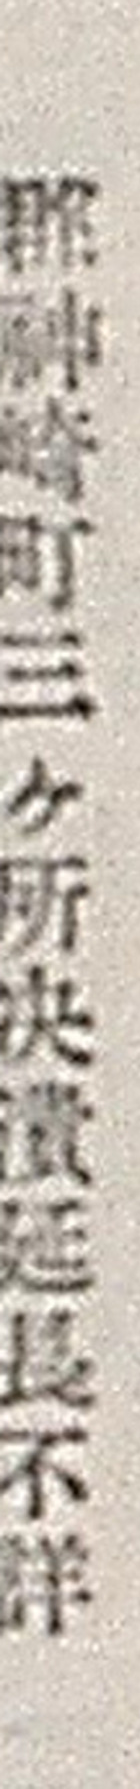郡神崎町三ヶ所决潰延長不詳
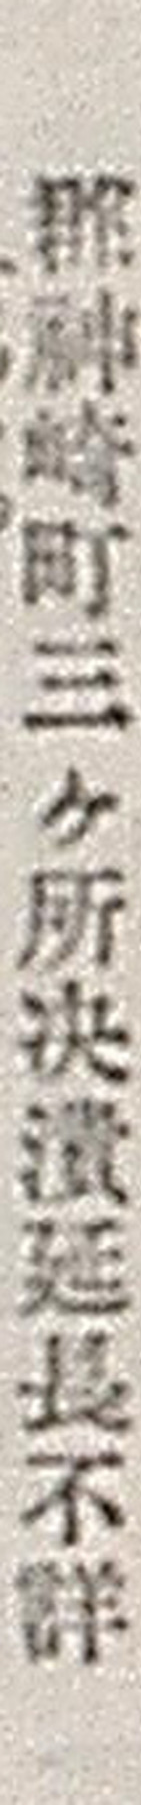郡神崎町三ヶ所决潰延長不詳
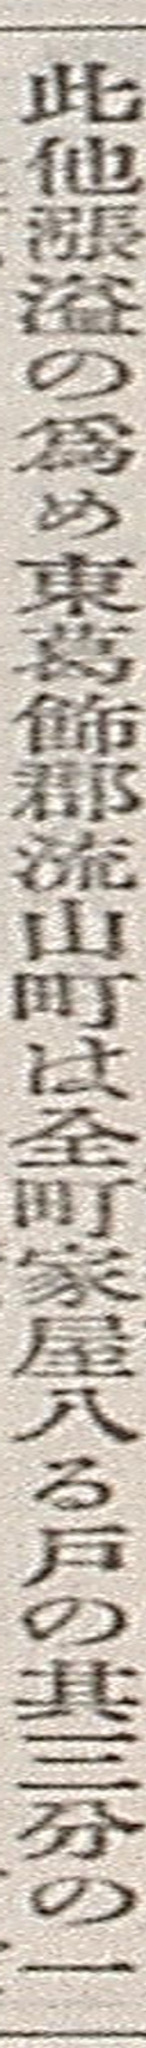此他漲溢の為め東葛飾郡流山町は全町家屋八る戸の其三分の一
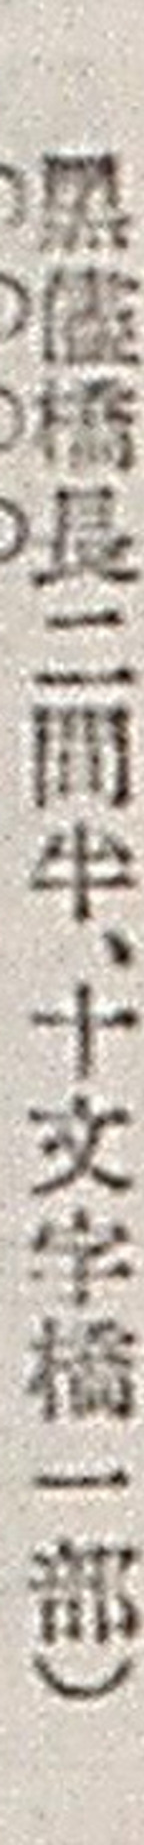儘橋長二間半、十文字橋一部）
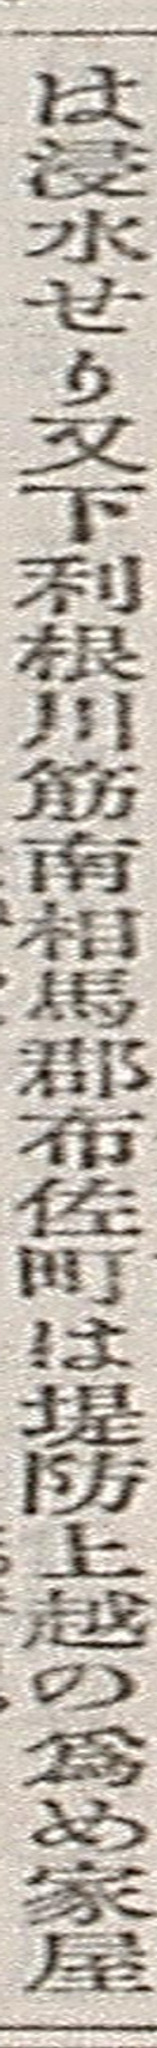は浸水せり又下利根川筋南相馬郡布佐町は堤防上越の為め家屋
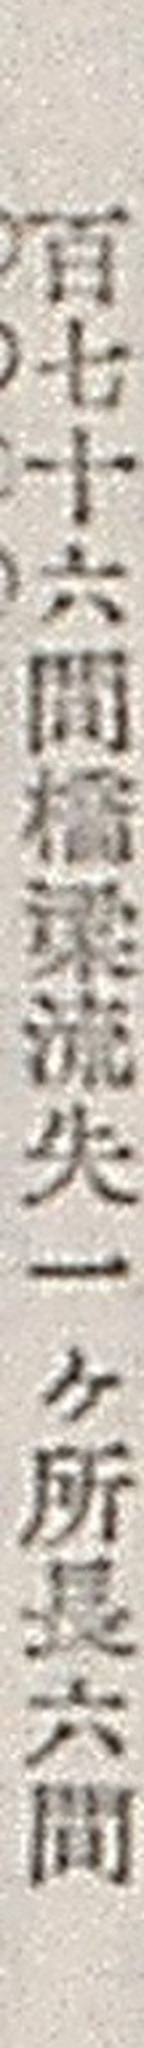百七十六間橋梁流失一ヶ所長六間
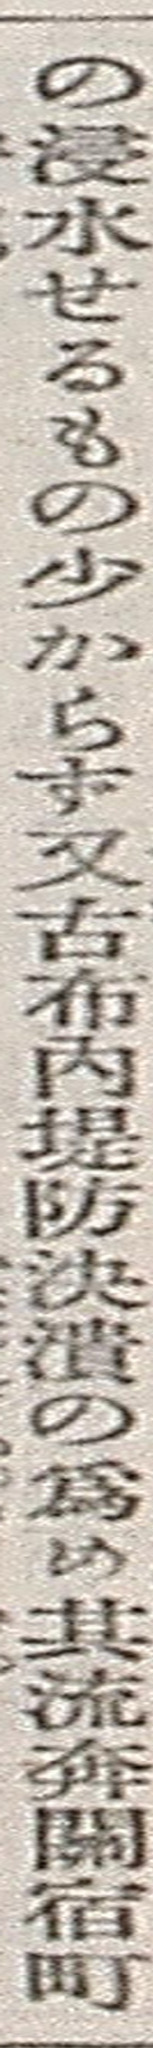の浸水せるもの少からず又古布内堤防決潰の為め其流奔関宿町
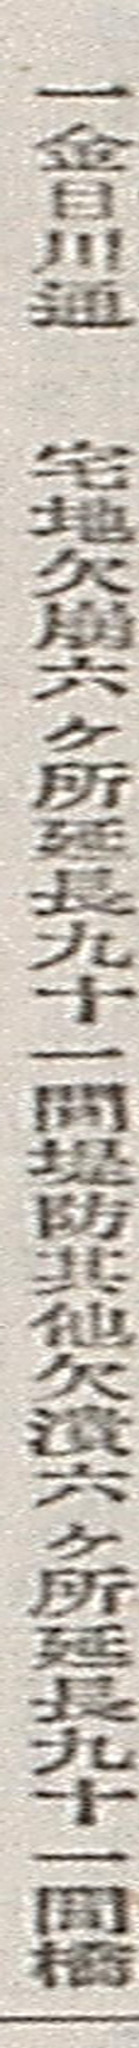一金目川通宅地欠崩六ヶ所延長九十一間堤防其他欠潰六ヶ所延長九十一間橋
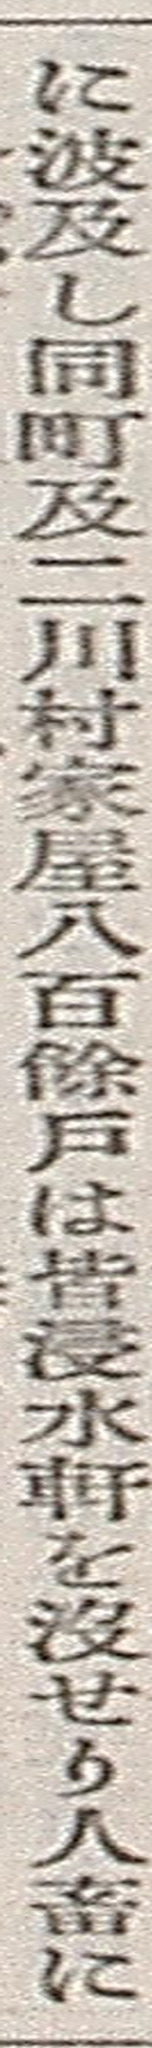に波及し同町及二川村家屋八百餘戸は皆浸水軒を没せり人畜に
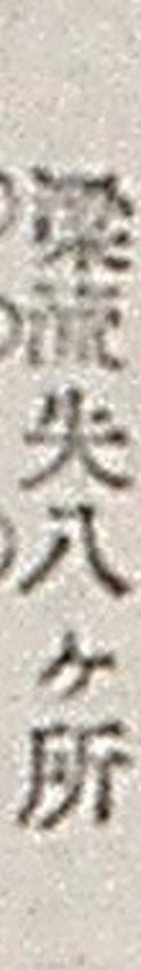梁流失八ヶ所
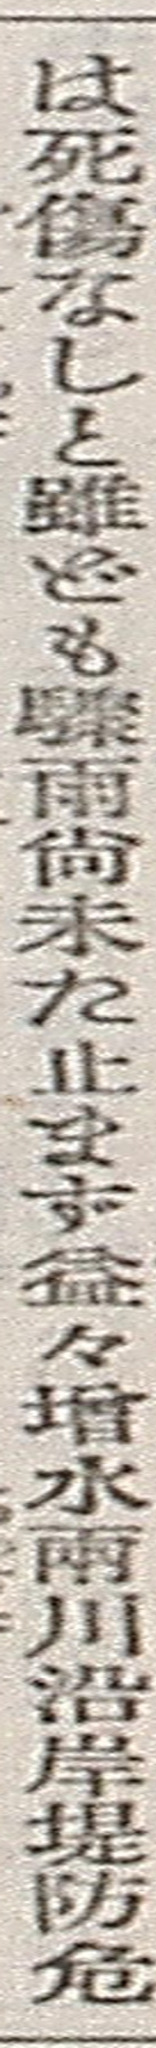は死傷なしと雖ども驟雨尚未た止まず益々増水両川沿岸堤防危
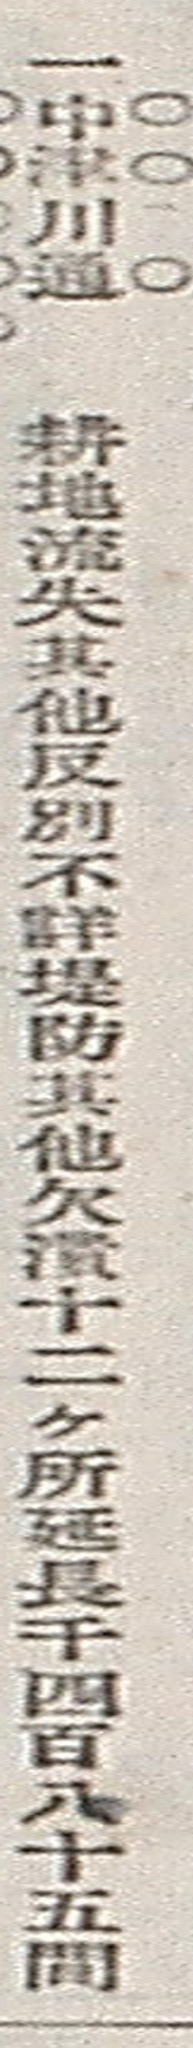一中津川通耕地流失其他反別不詳堤防其他欠潰れ十二ヶ所延長千四百八十五間
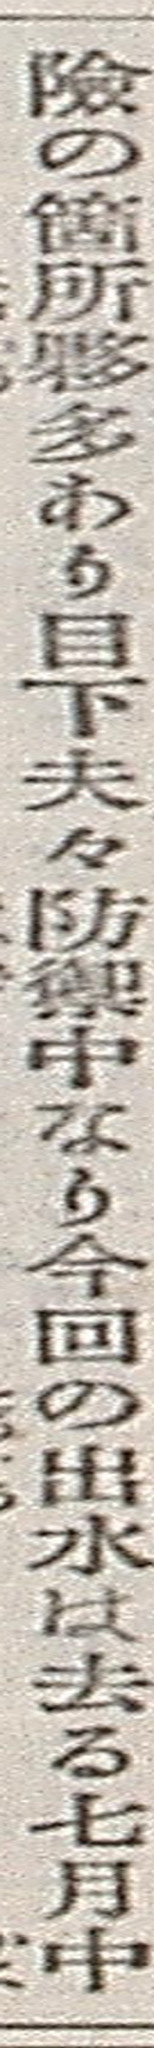険の箇所夥多あり目下夫々防禦中なり今回の出水は去る七月中
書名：風俗畫報臨時増刊第百二十八號　洪水被害録（下）
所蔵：東京大学地震研究所図書室 Earthquake Research Institute Library, The University of Tokyo, JAPAN
